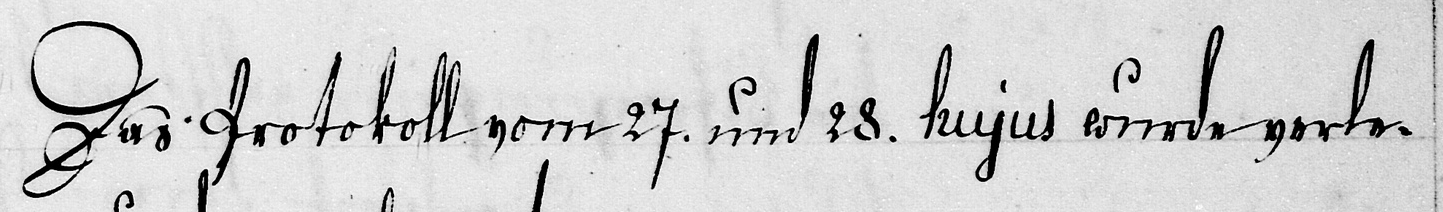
Das Protokoll vom 27. und 28. hujus wurde verle¬
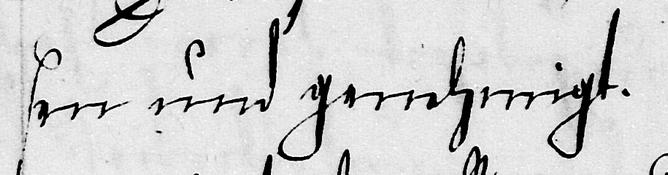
sen und genehmigt.
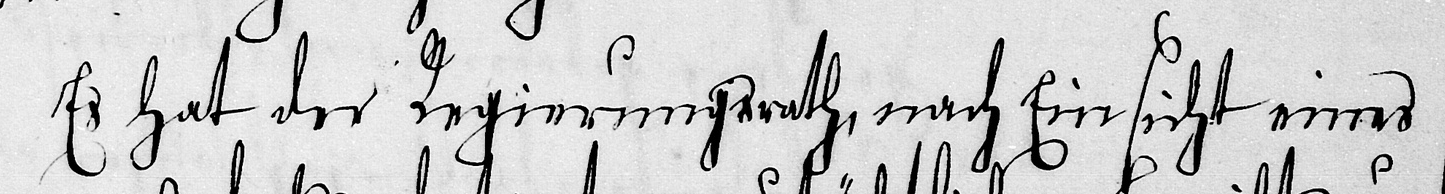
Es hat der Regierungsrath, nach Einsicht eines
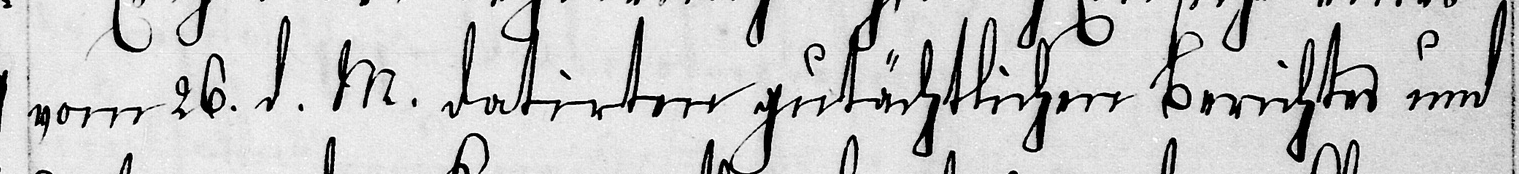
vom 26. d. M. datirten gutächtlichen Berichtes und
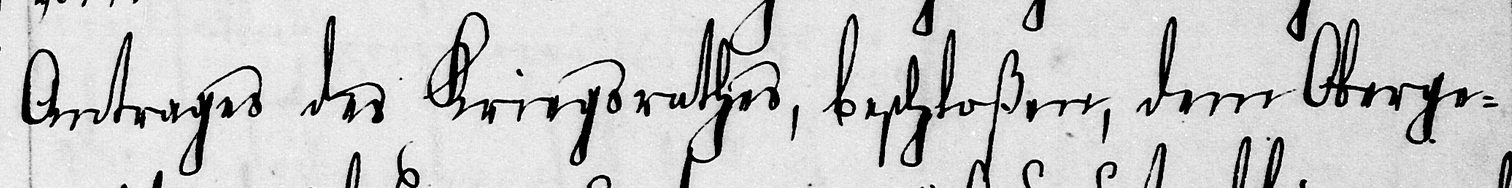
Antrages des Kriegsrathes, beschloßen, dem Oberge¬
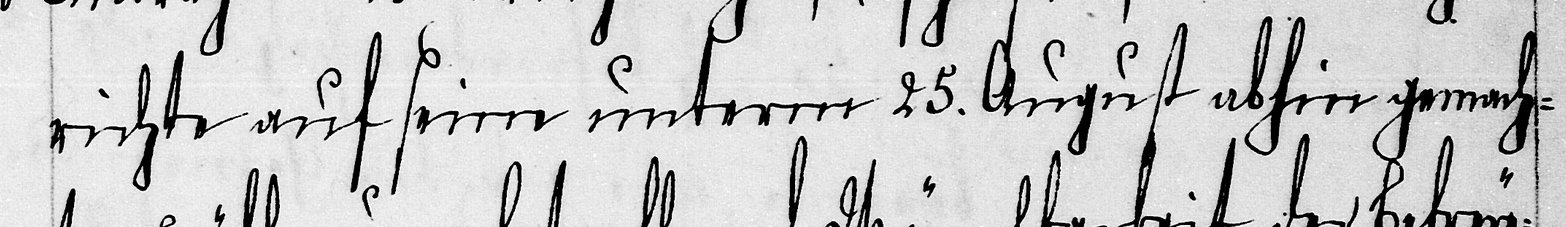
richte auf seine unterm 25. August abhin gemach¬
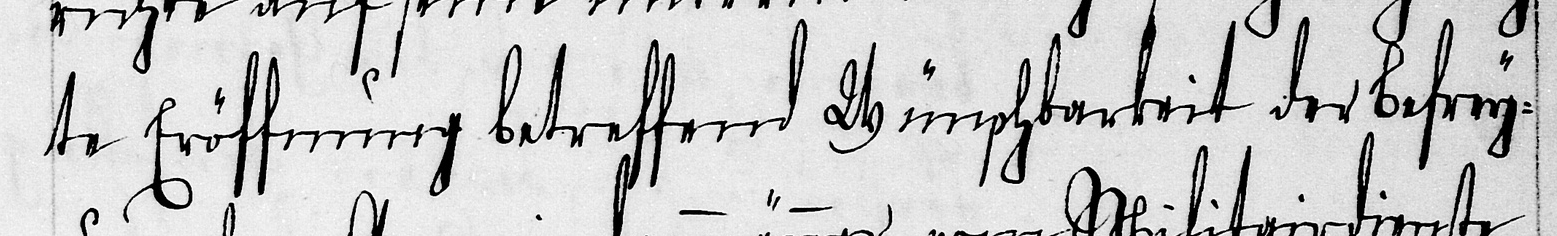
te Eröffnung betreffend Wünschbarkeit der Befrey¬
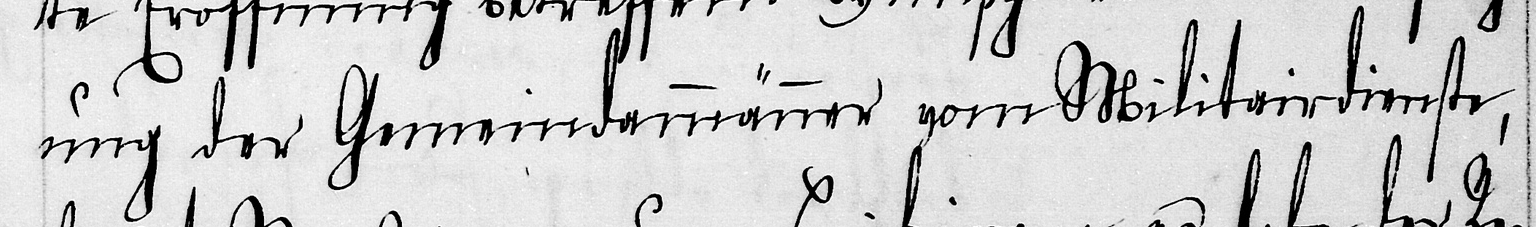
ung der Gemeindammänner vom Militairdienste,
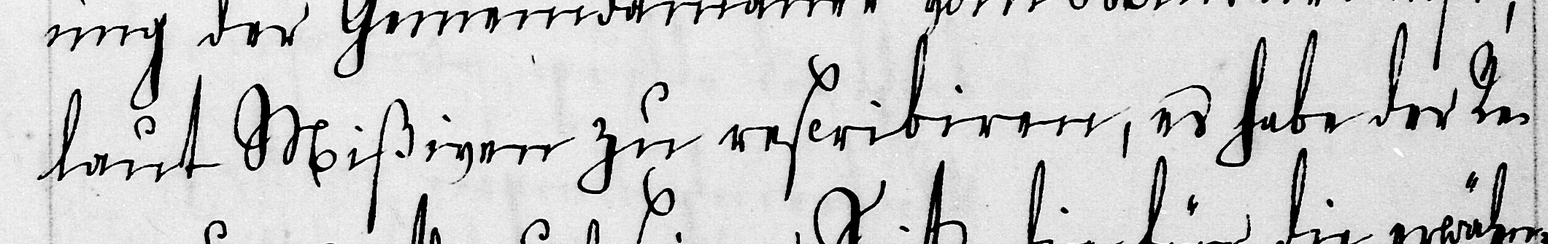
laut Mißiven zu rescribiren, es habe der Re¬
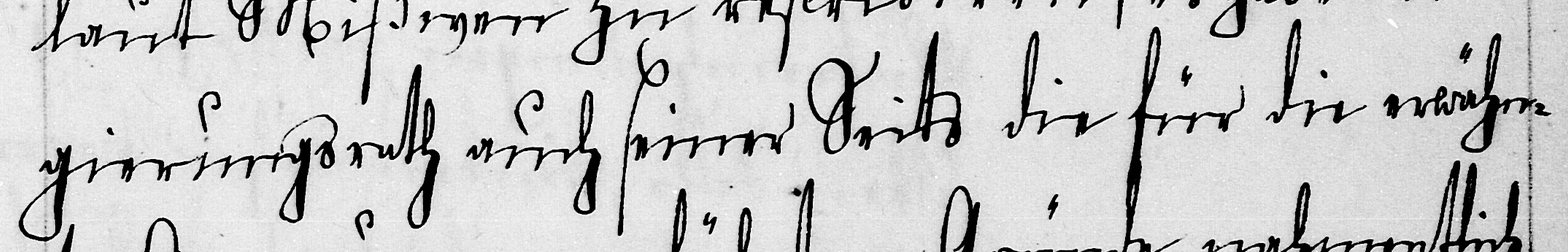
gierungsrath auch seiner Seits die für die erwähn¬
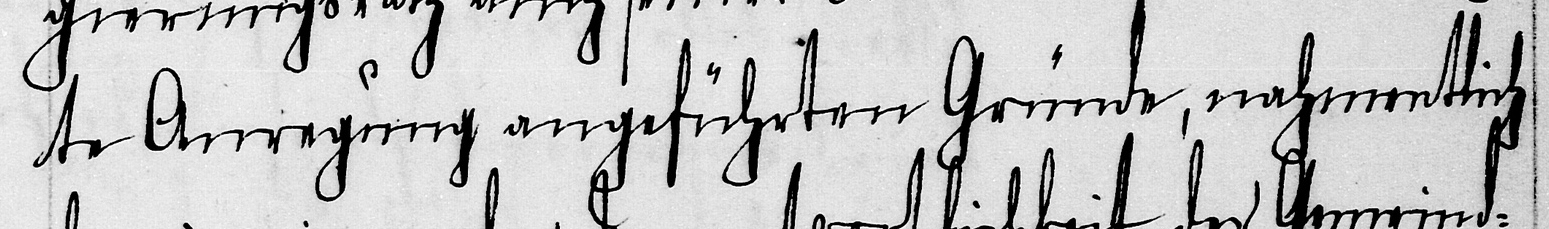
te Anregung angeführten Gründe, nahmentlich
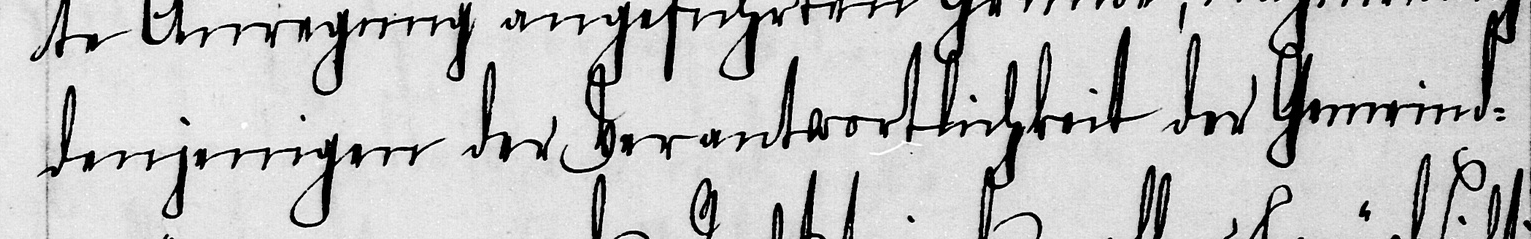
denjenigen der Verantwortlichkeit der Gemeind¬
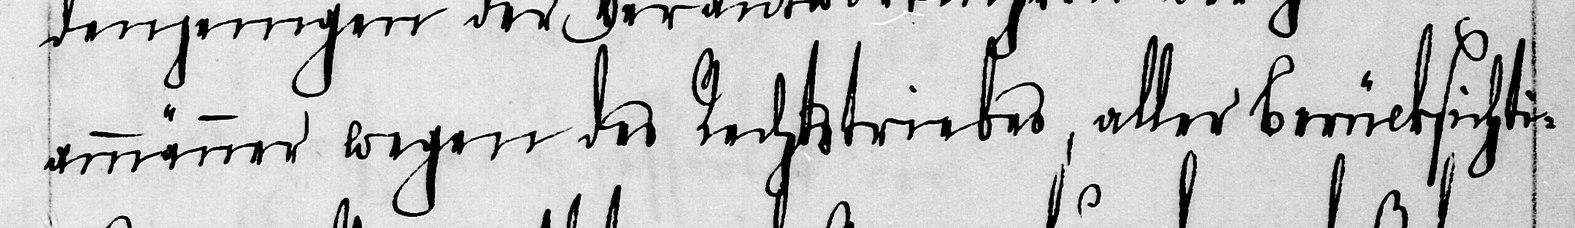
ammänner wegen des Rechtstriebes, aller Berücksichti¬
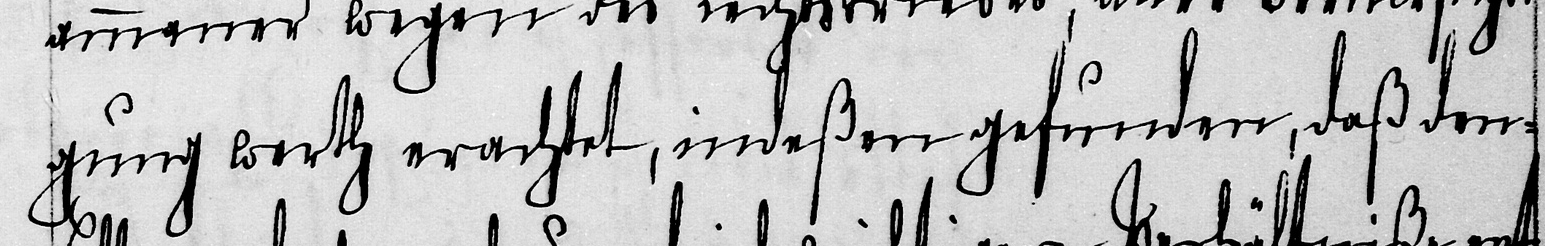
gung werth erachtet, indeßen gefunden, daß den¬
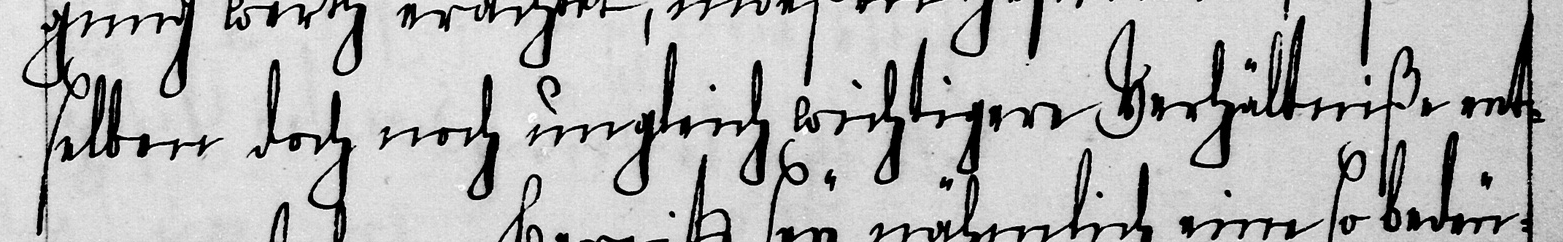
selben doch noch ungleich wichtigere Verhältniße ent¬
